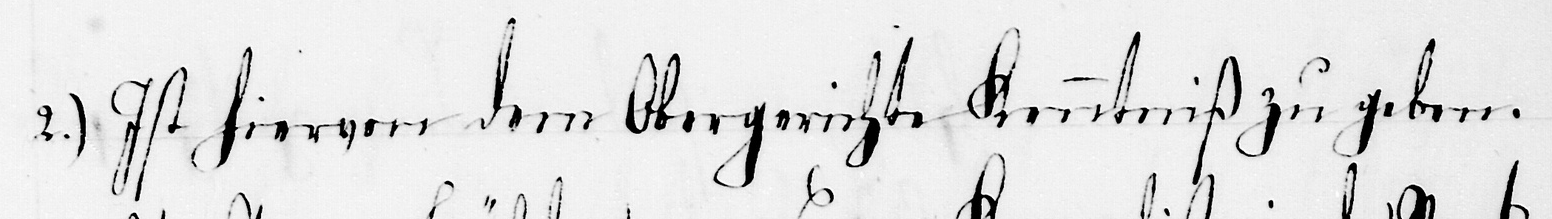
2.) Ist hiervon dem Obergerichte Kenntniß zu geben.
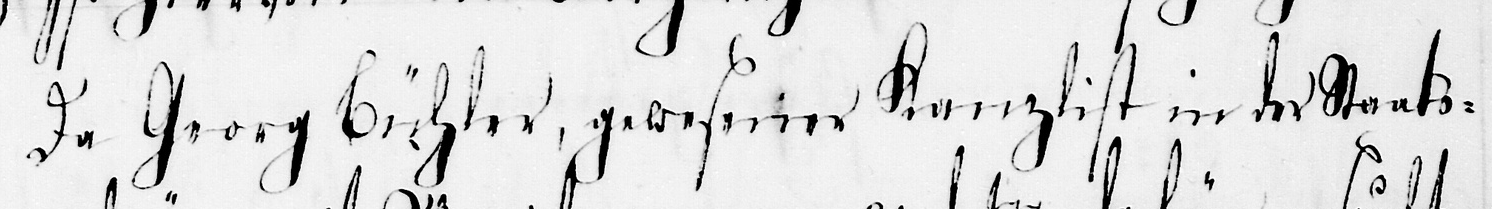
Da Georg Bühler, gewesener Kanzlist in der Staats¬
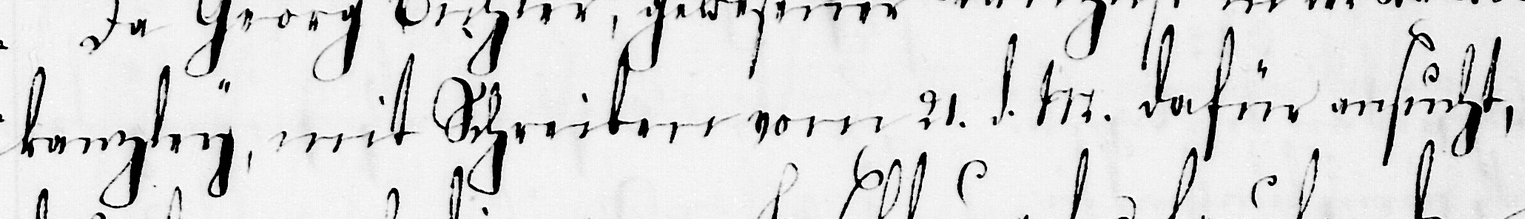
kanzley, mit Schreiben vom 21. d. M. dafür ansucht,
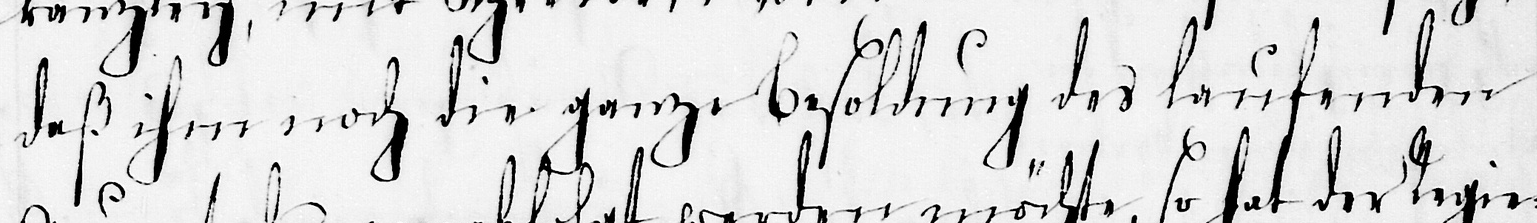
daß ihm noch die ganze Besoldung des laufenden
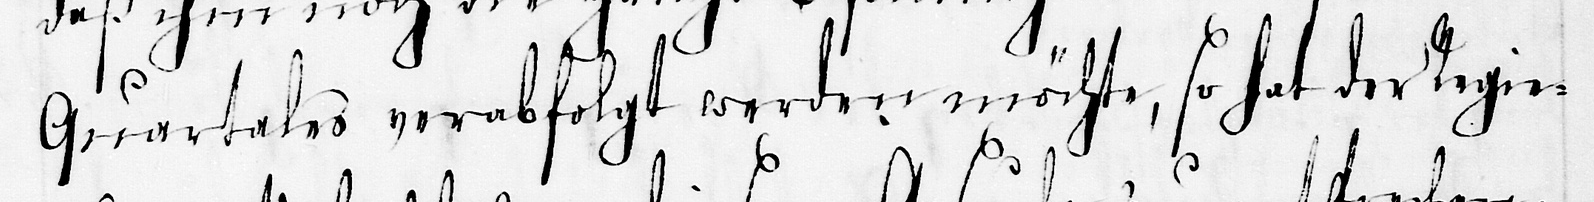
Quartales verabfolgt werden möchte, so hat der Regie¬
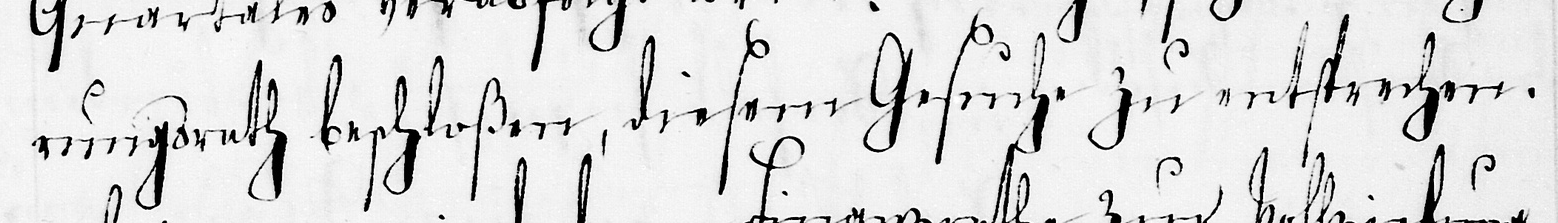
rungsrath beschloßen, diesem Gesuche zu entsprechen.
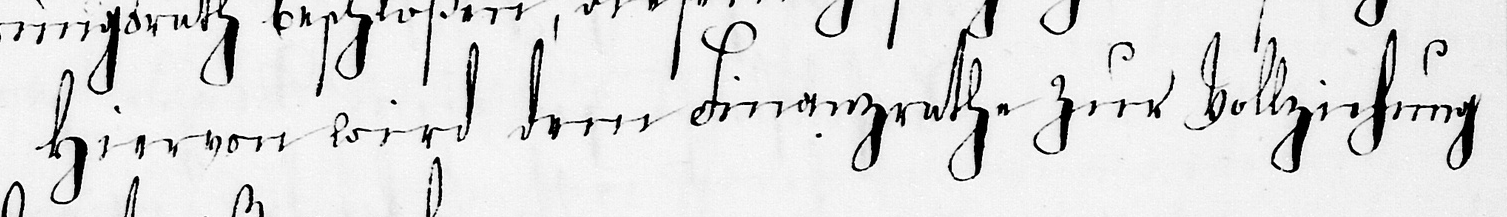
Hiervon wird dem Finanzrathe zur Vollziehung
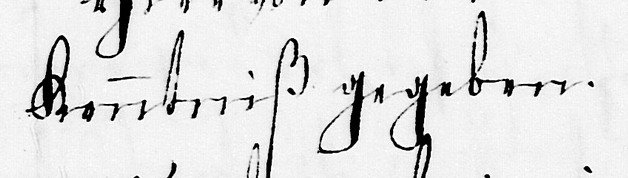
Kenntniß gegeben.
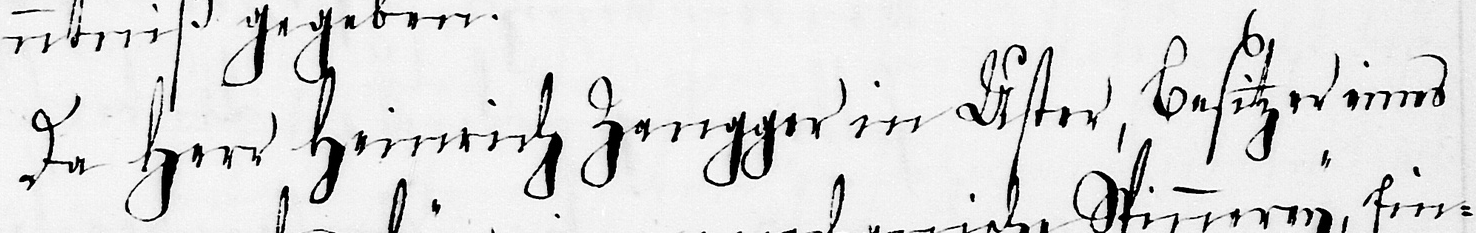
Da Herr Heinrich Zangger in Uster, Besitzer eines
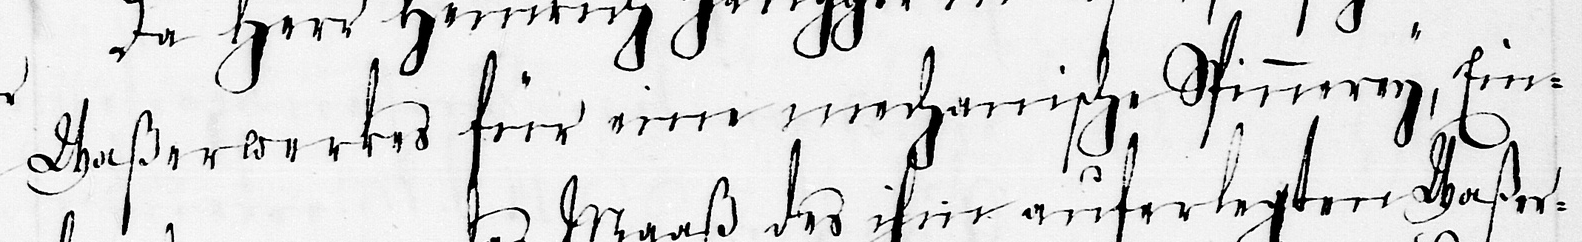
Waßerwerkes für eine mechanische Spinnerey, Ein¬
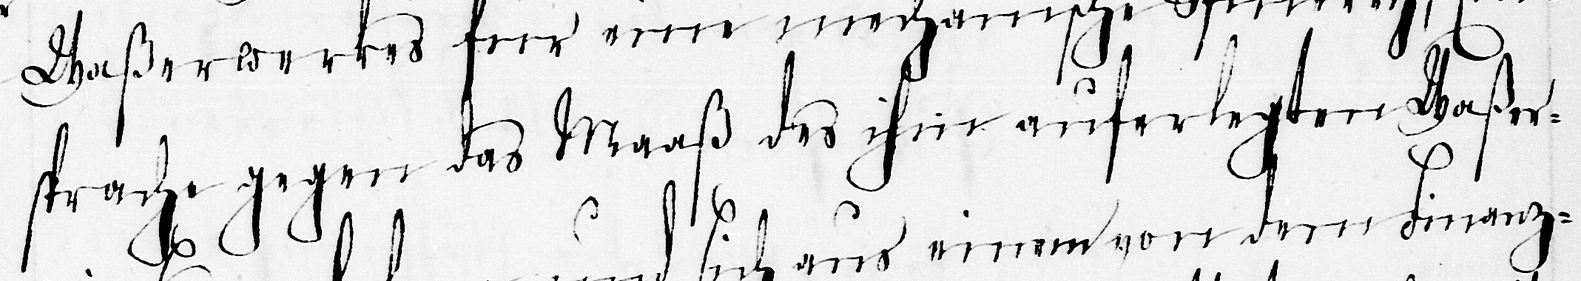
sprache gegen das Maaß des ihm auferlegten Waßer¬
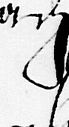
8.
